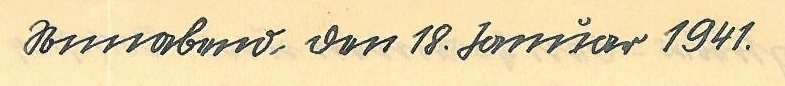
Sonnabend, den 18. Januar 1941.
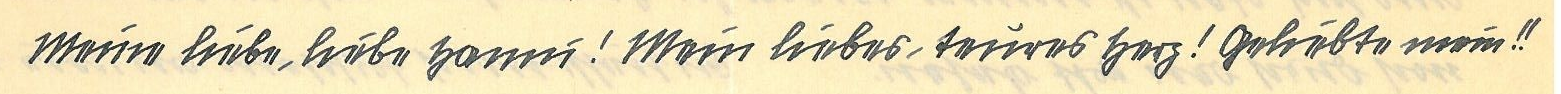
Meine liebe, liebe ! Mein liebes, teures Herz! Geliebte mein!!
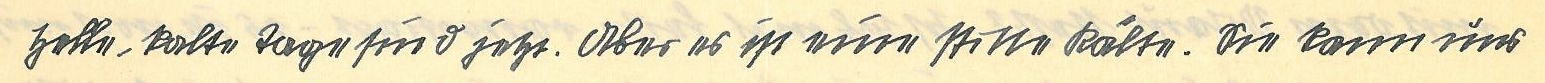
Helle, klare Tage sind jetzt. Aber es ist eine stille Kälte. Sie kann uns
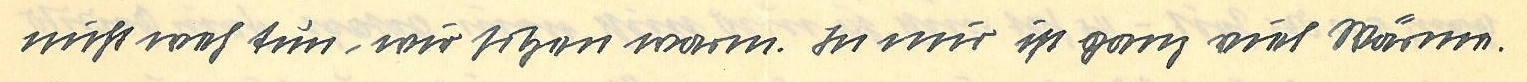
nicht weh tun, wir sitzen warm. In mir ist ganz viel Wärme.
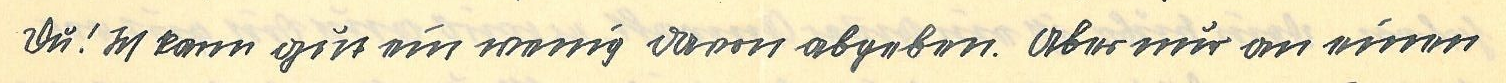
Du! Ich kann gut ein wenig davon abgeben. Aber nur an einen
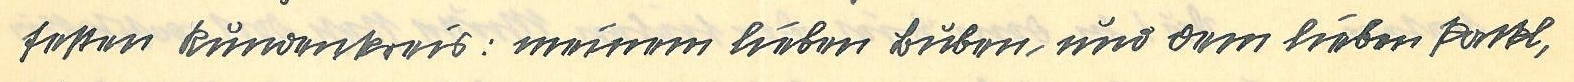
festen Kundenkreis: meinen lieben Buben, und dem lieben Packl,
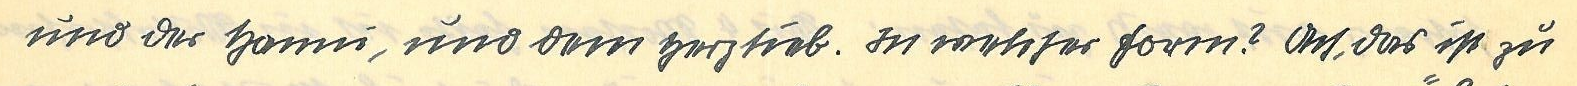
und der , und dem Herzlieb. In welcher Form? Ach, das ist zu
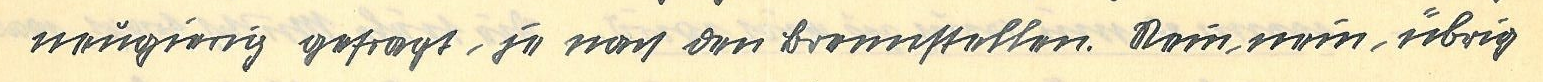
neugierig gefragt, je nach den Brennstellen. Nein, nein, übrig
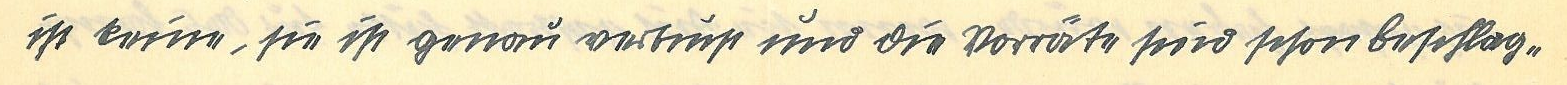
ist keine, sie ist genau verbucht und die Vorräte sind schon beschlag¬
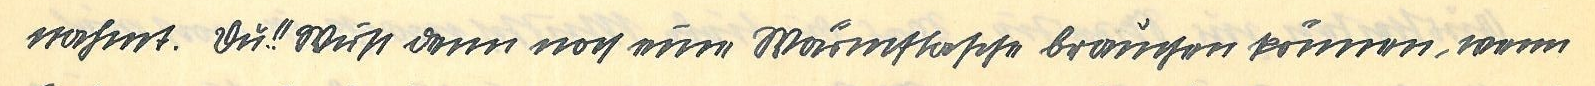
nahmt. Du!! Wirst dann noch eine Wärmflasche brauchen können, wenn
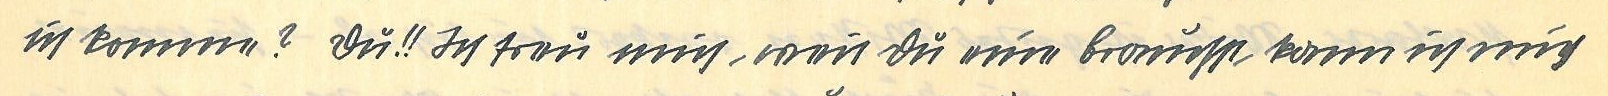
ich komme? Du!! Ich freu mich, weil Du eine brauchst, kann ich mich
